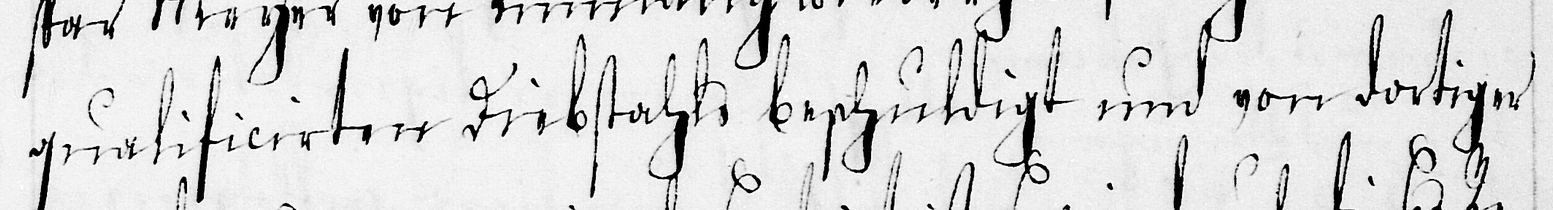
qualificirten Diebstahls beschuldigt und von dortiger
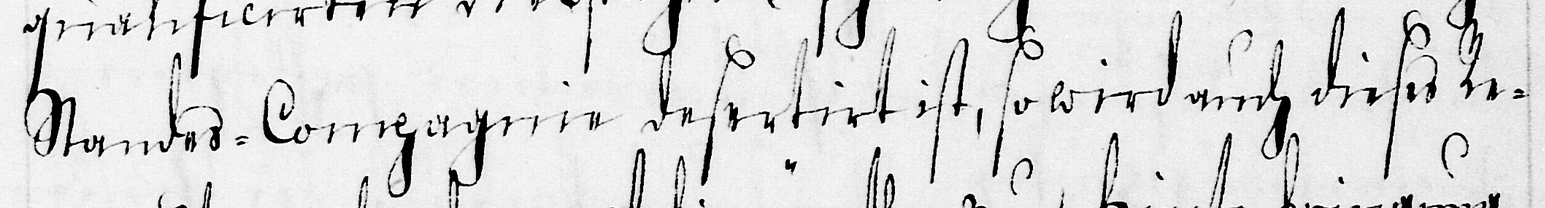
Standes-Compagnie desertirt ist, so wird auch dieses Re¬
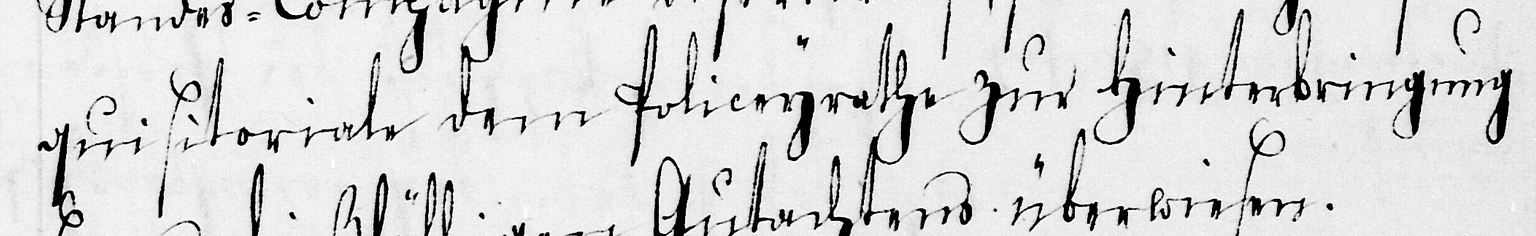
quisitoriale dem Policeyrathe zur Hinterbringung
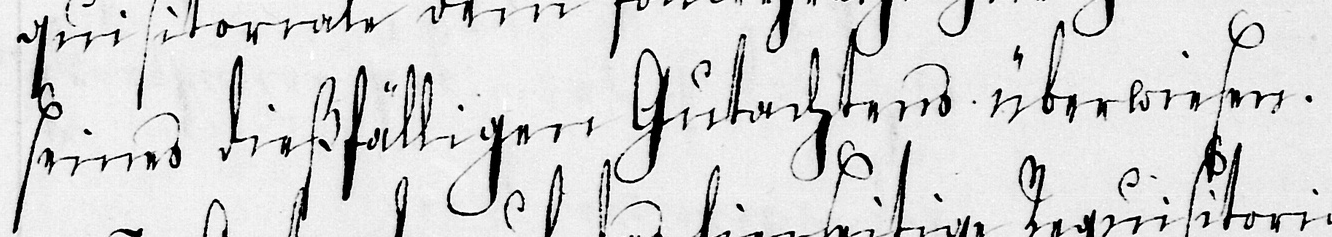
seines dießfälligen Gutachtens überwiesen.
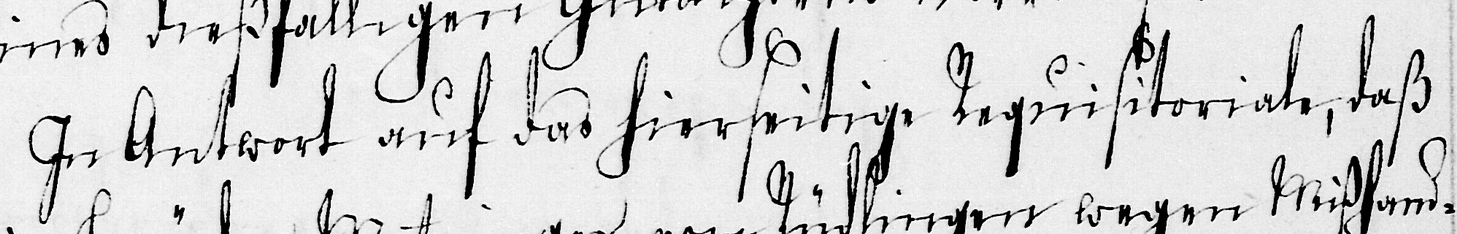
In Antwort auf das hierseitige Requisitoriale, daß
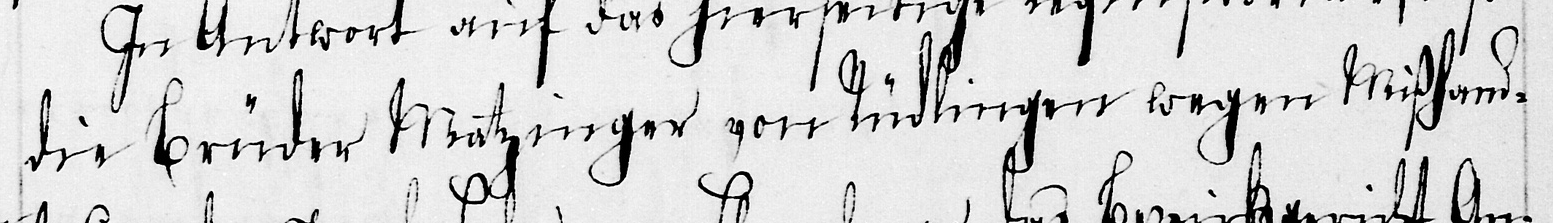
die Brüder Matzinger von Rüdlingen wegen Mißhand¬
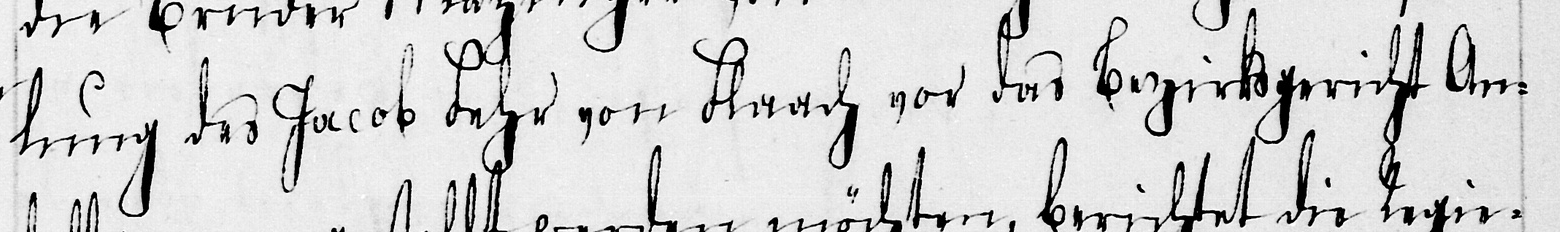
lung des Jacob Fehr von Flaach vor das Bezirksgericht An¬
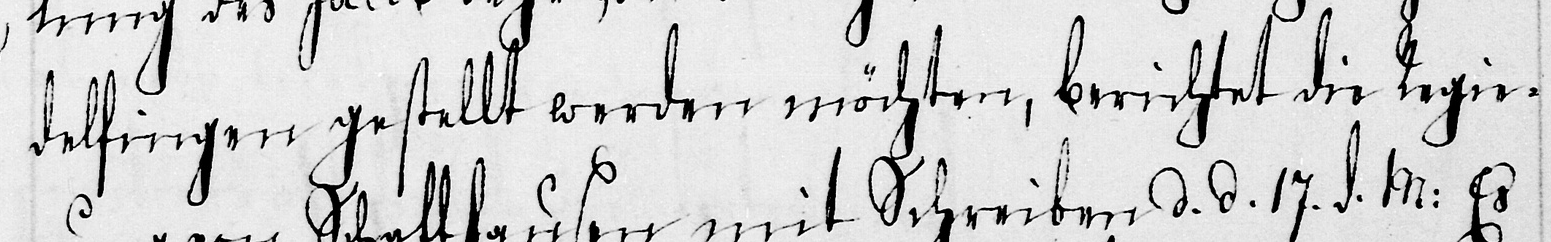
delfingen gestellt werden möchten, berichtet die Regie¬
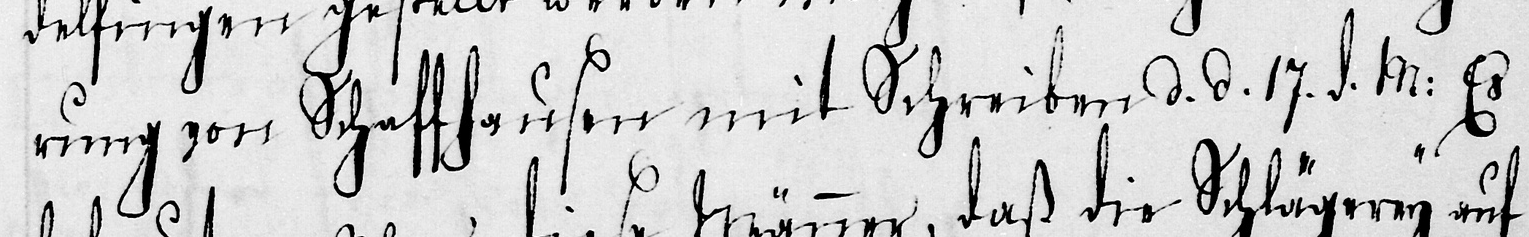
rung von Schaffhausen mit Schreiben d. d. 17. d. M: Es
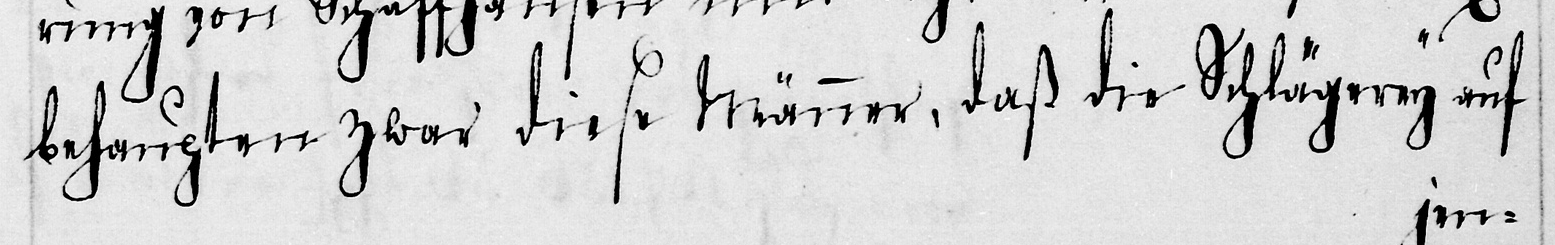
behaupten zwar diese Männer, daß die Schlägerey auf
